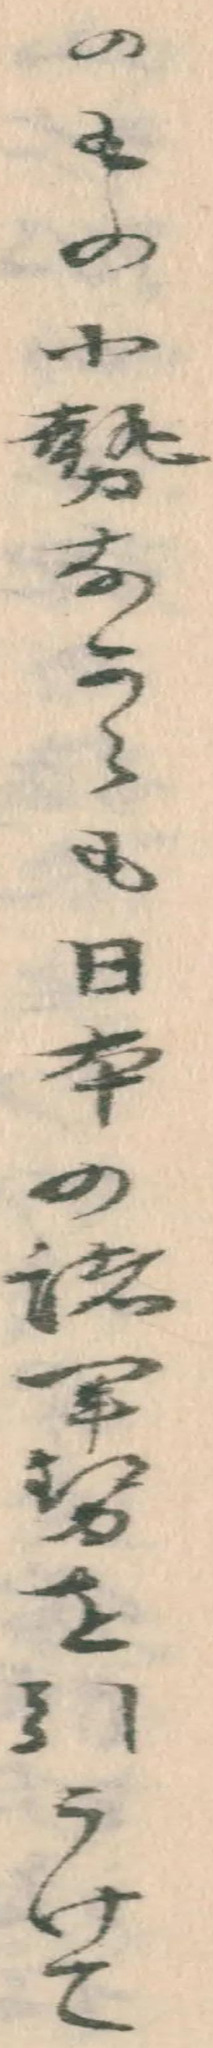のもの小勢なからも日本の諸軍㔟を引うけて
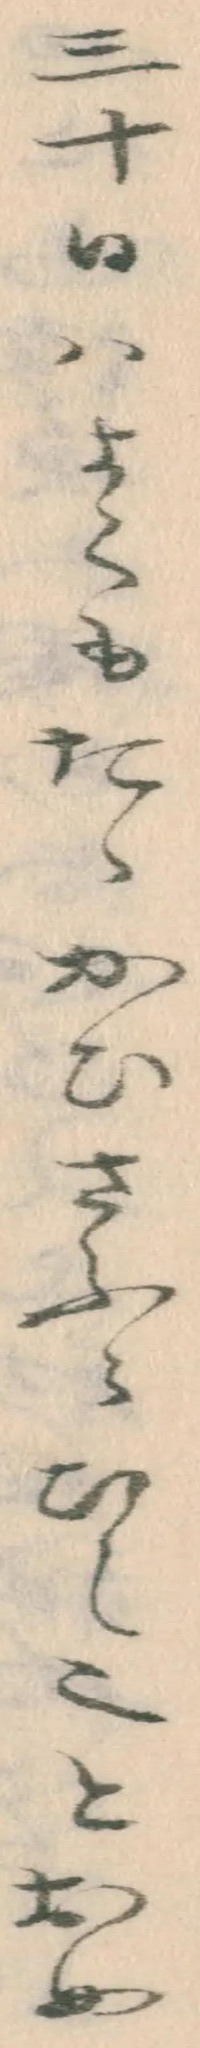三十日はよくもたゝかひさふらひし也とおめ
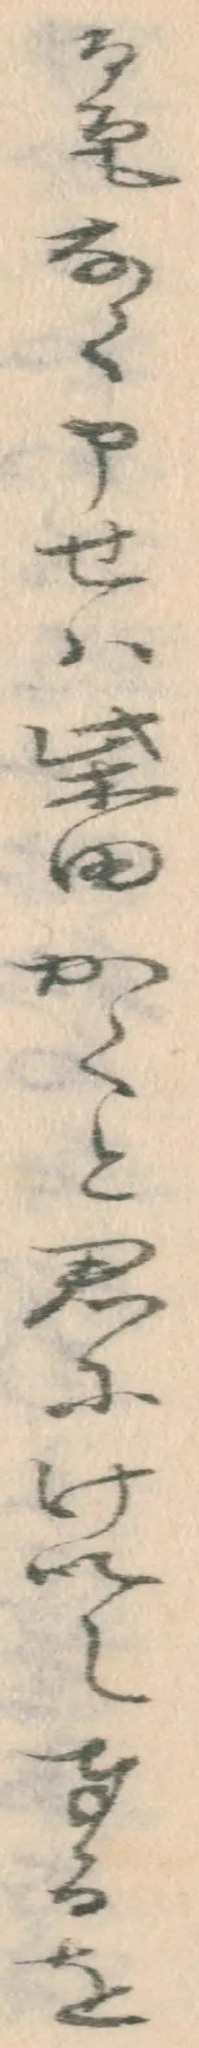る色なく申せは柴田かくと君にけいし奉るを
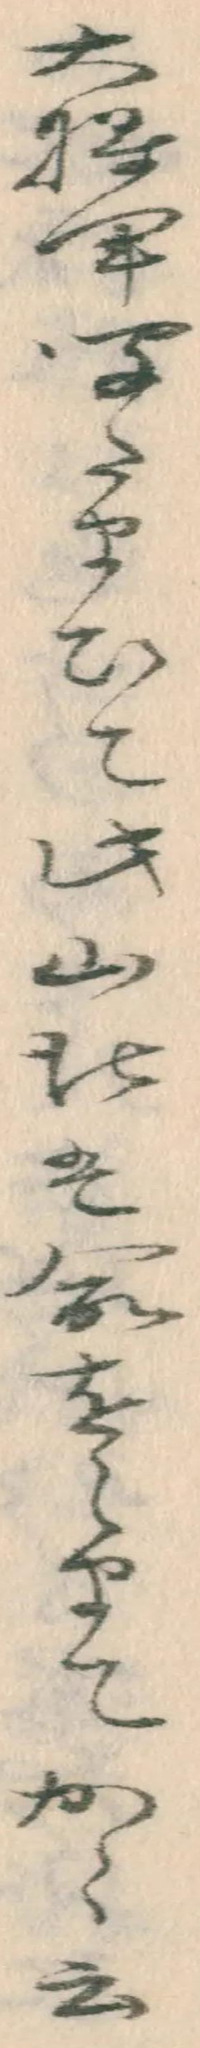大将軍聞たまひて此山北は命をしまてかく云
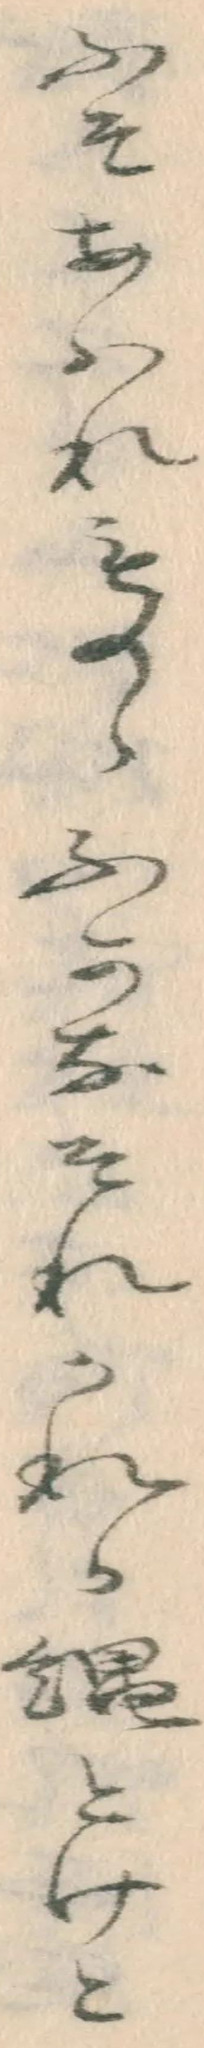ふそあはれものゝふかなそれかれか縄とけと
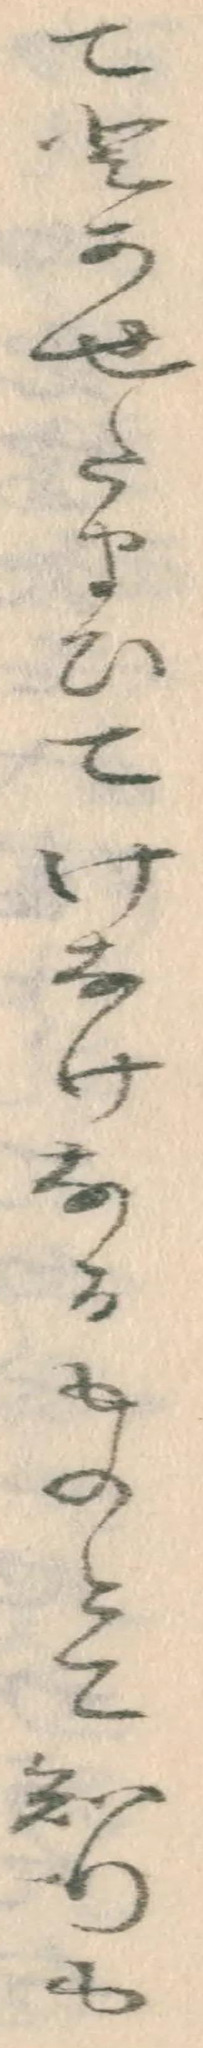てとかせたまひてけなけなるものとて知行も
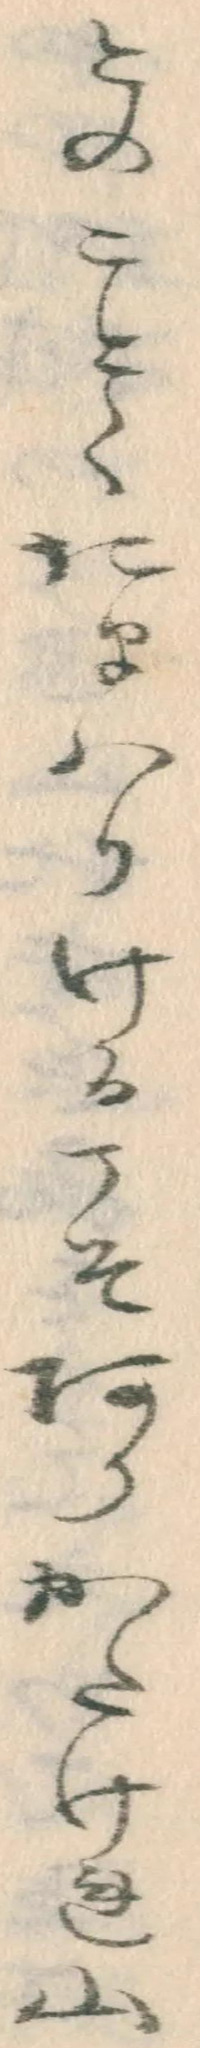とのことくたまはりけるこそありかたけれ山
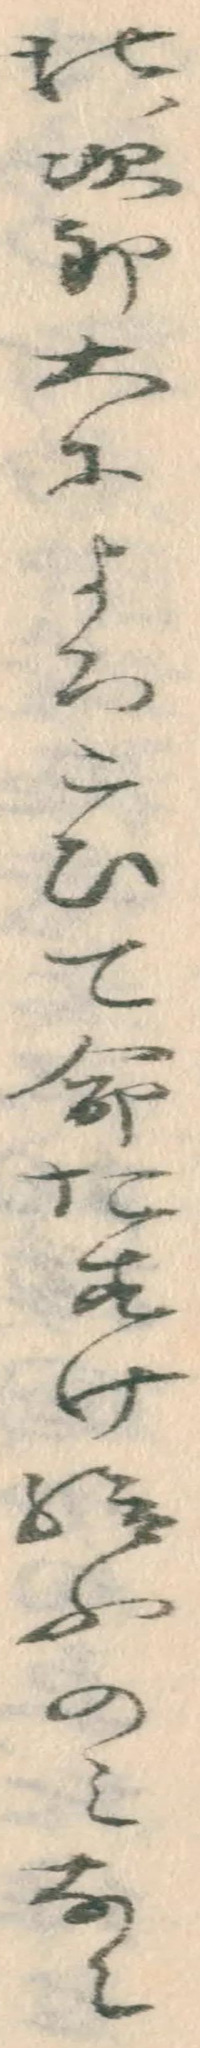北次郎大によろこひて命たすけ給ふのみなら
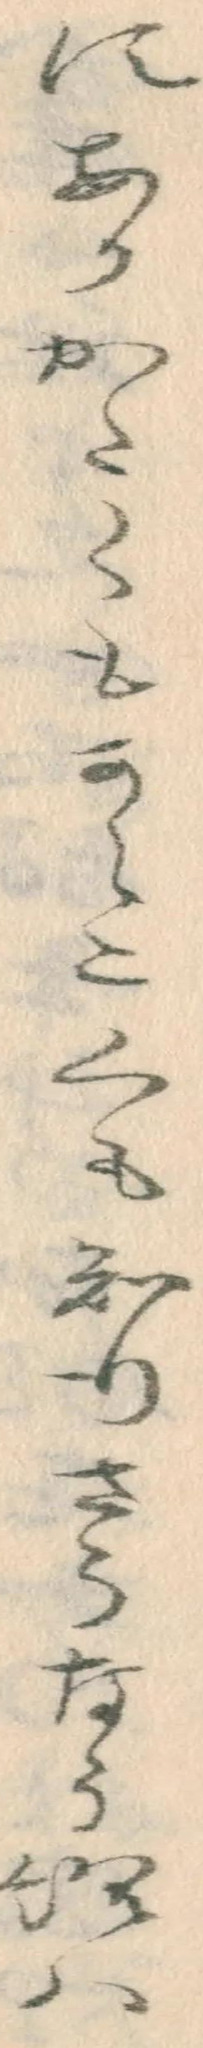すありかたくもかしこくも知行さうなう給は
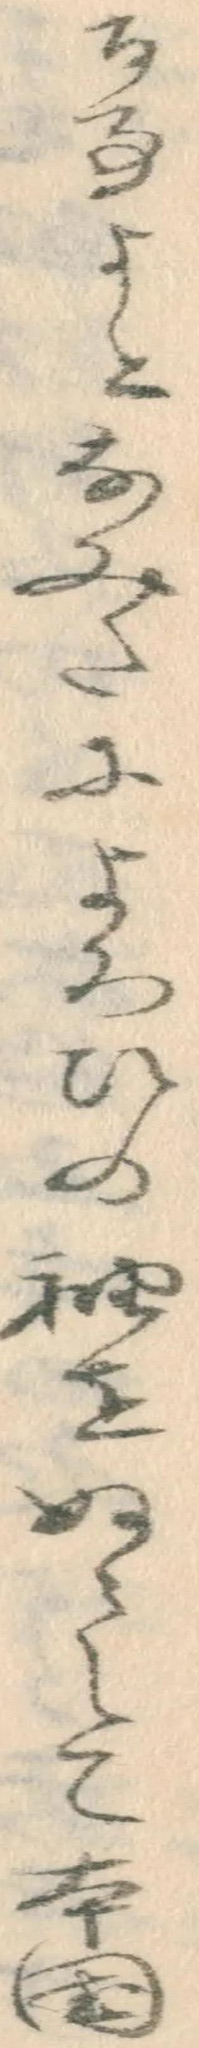る事よとなみたによろひの袖をぬらして本国

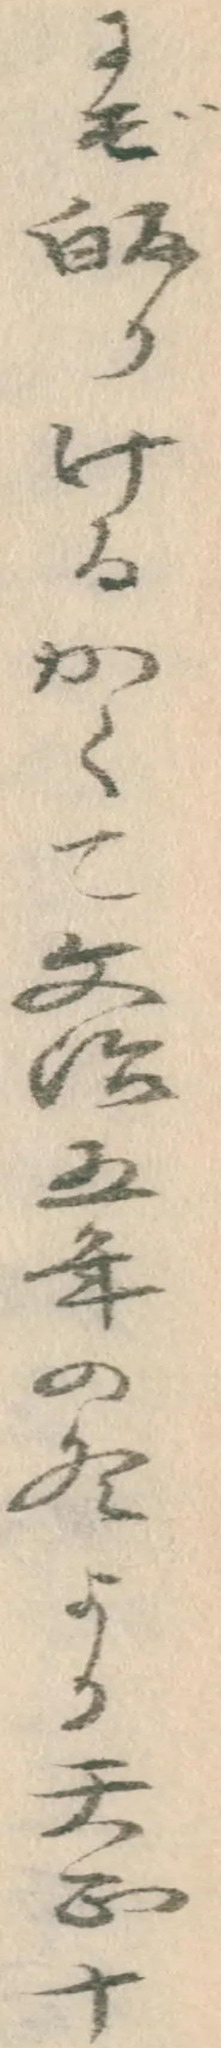にぞ皈りけるかくて文治五年の冬より天正十
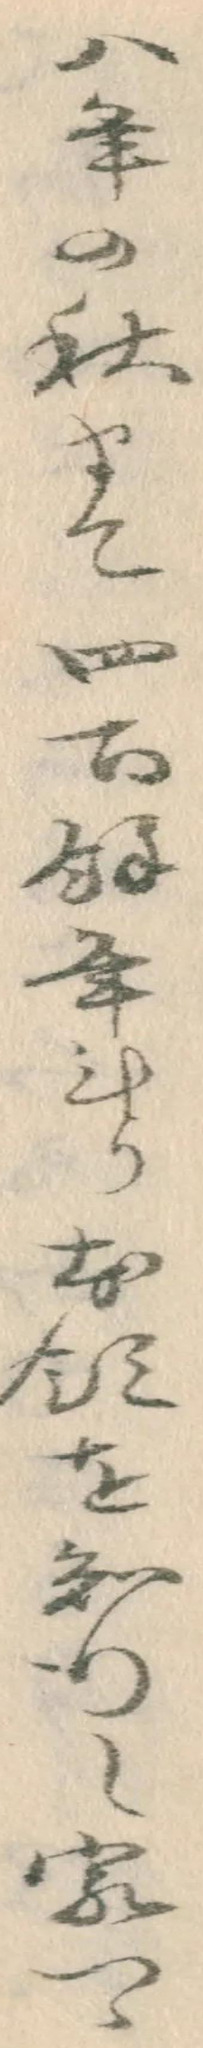八年の秋まて四百餘年斗り本領を知行し家つゝ
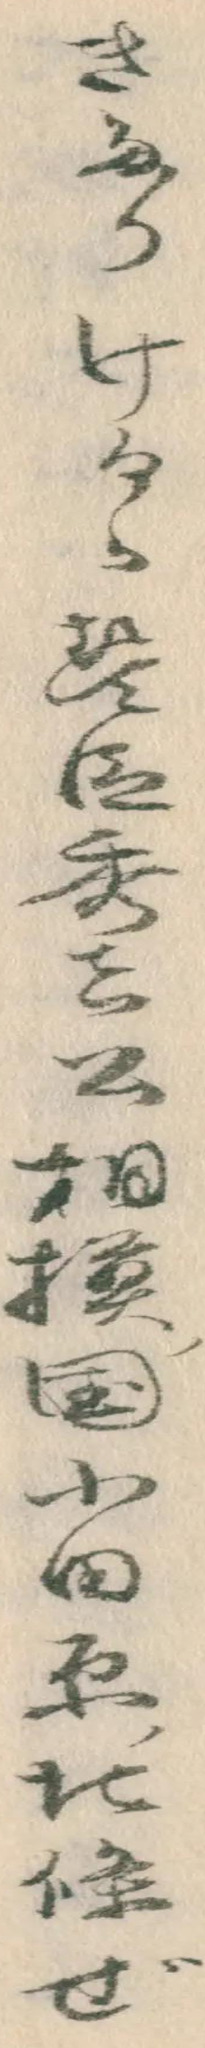きたりけるか豊臣秀吉公相摸国小田原北條ぜ
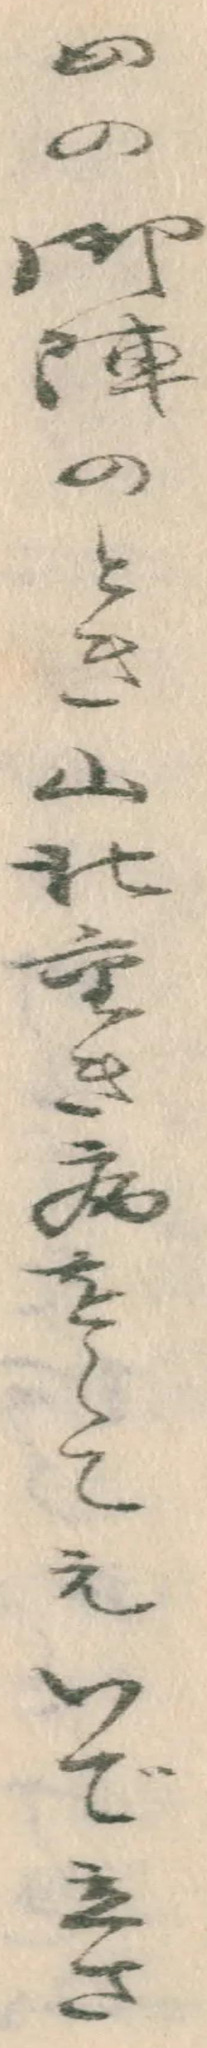めの御陣のとき山北重き病をしてえいで立さ
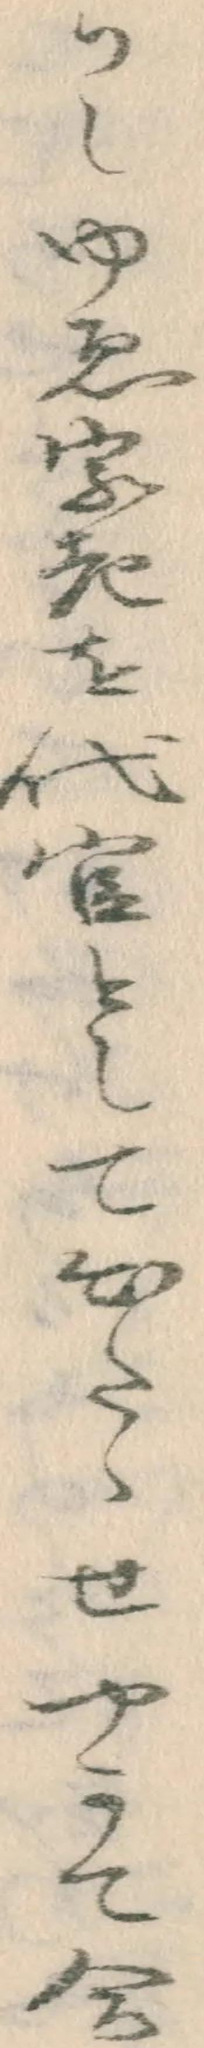りしゆゑ家老を代官として出たゝせやかて合
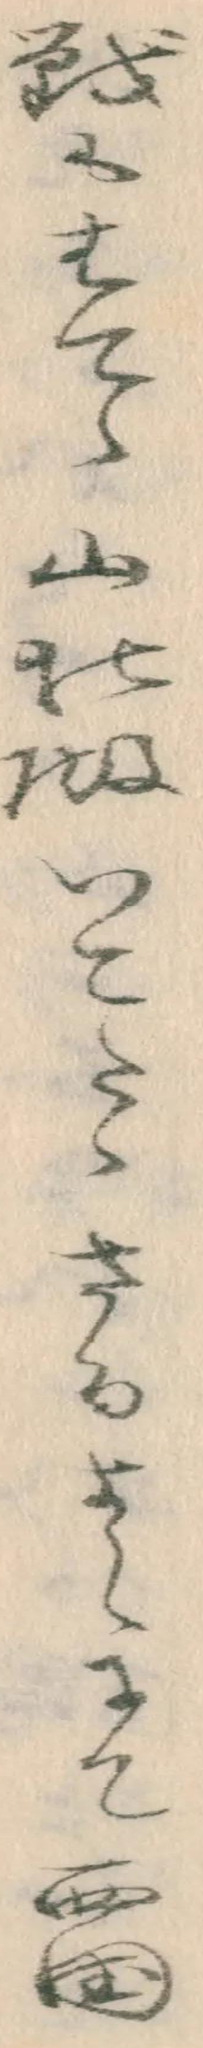戦もはてゝ山北殿いてたゝさるよしにて西国
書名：眞澄遊覽記[第2冊]
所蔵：国立国会図書館 National Diet Library, JAPAN
